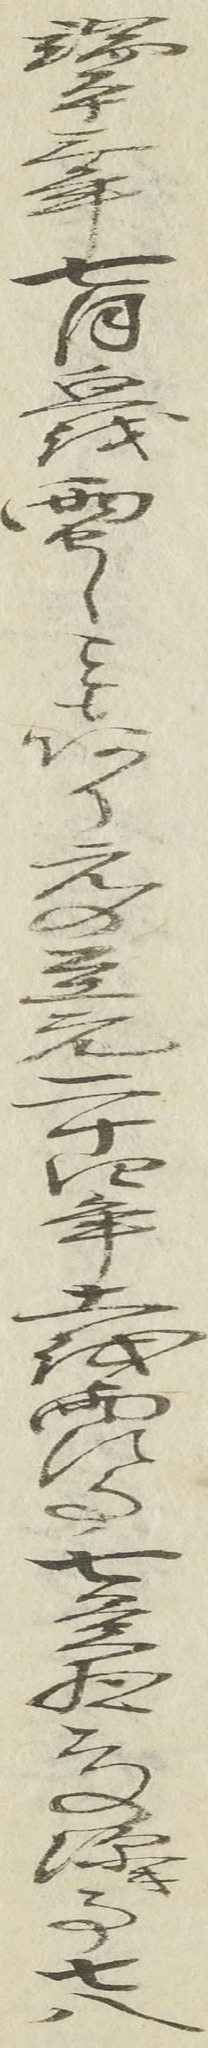端本三年七月血を雨セしこともあり元の至元二十四年土を雨す事七昼夜その深キ事七八
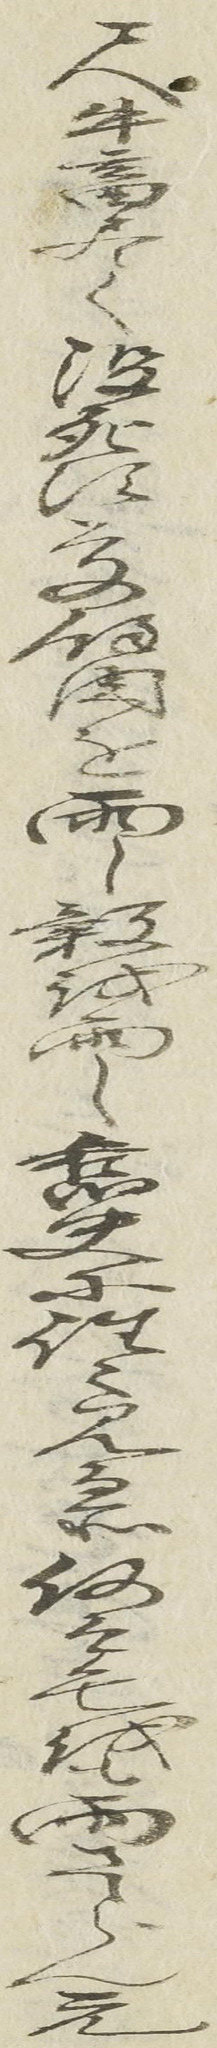尺牛畜尽く没死すその余肉を雨し穀を雨し舊史に往〻見る所何そ毛をも雨さらん元
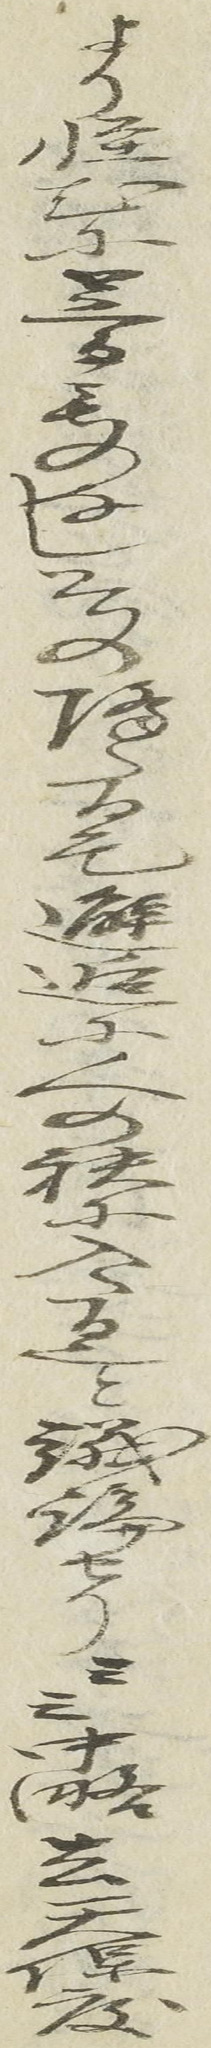より怪むに足るものなしその降たる毛邂逅に人の袂に入たる也と議論セり云云中略去天保度
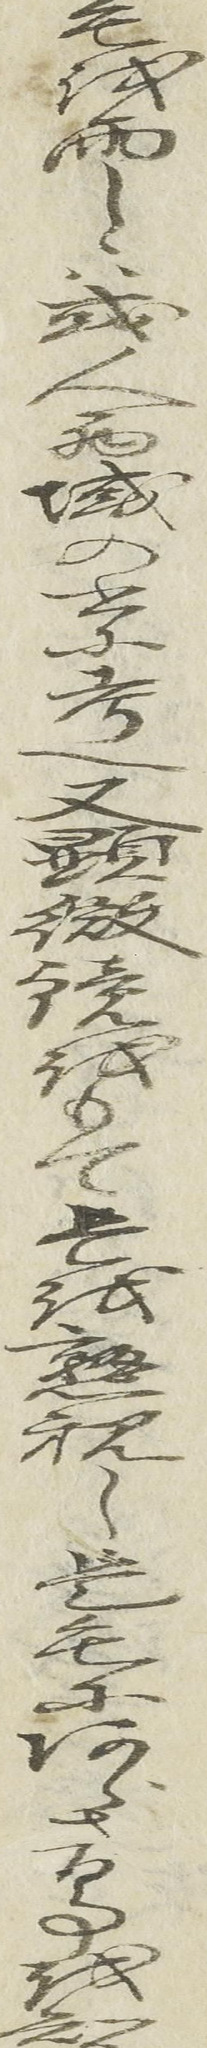毛を雨しとハ或人西域の書に考へ又顕微鏡をもて是を熟視し是毛にあらさる事を知り
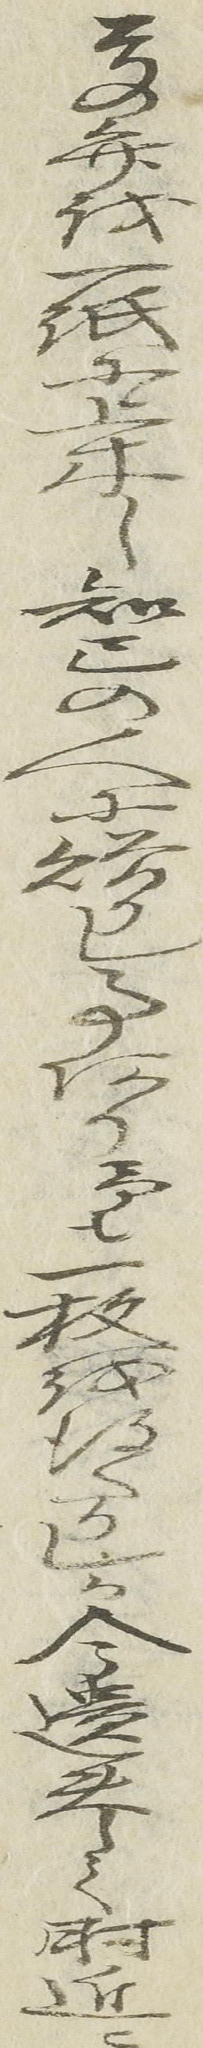その弁を一紙に上木し知己の人に贈りし事あり予も一枚を得たりしか今遺失して肘近ニ
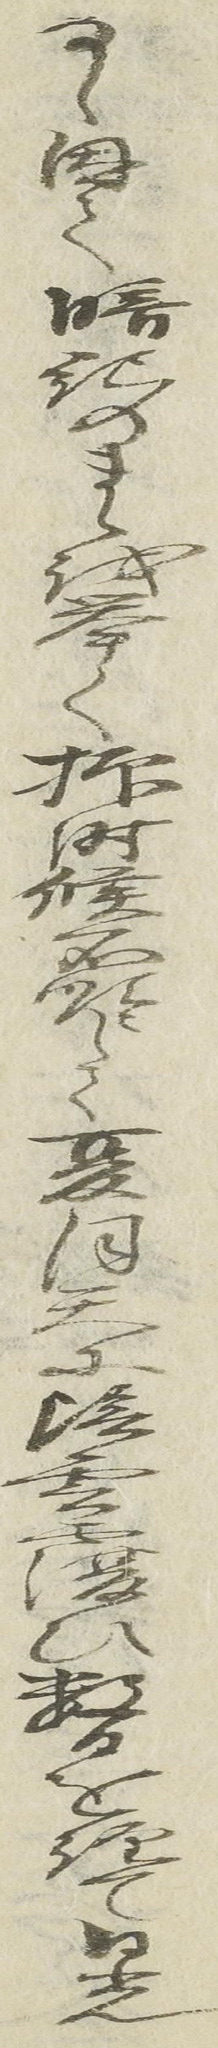なし因て暗記のまゝを挙く抑時候不順ニして夏月天に陰雲覆ひ数日を経て日光
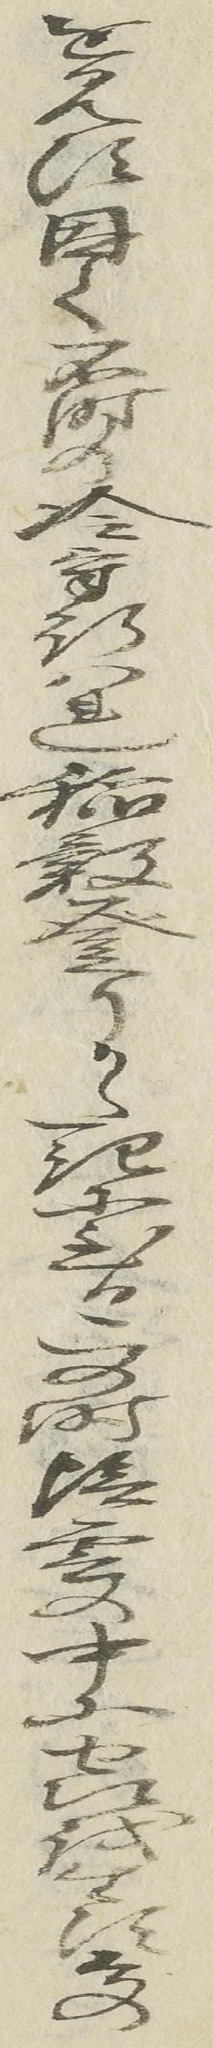を見す因て不時の冷気行ハれ稲穀登りかたきに到而この時陰雲の中にセいを生すその
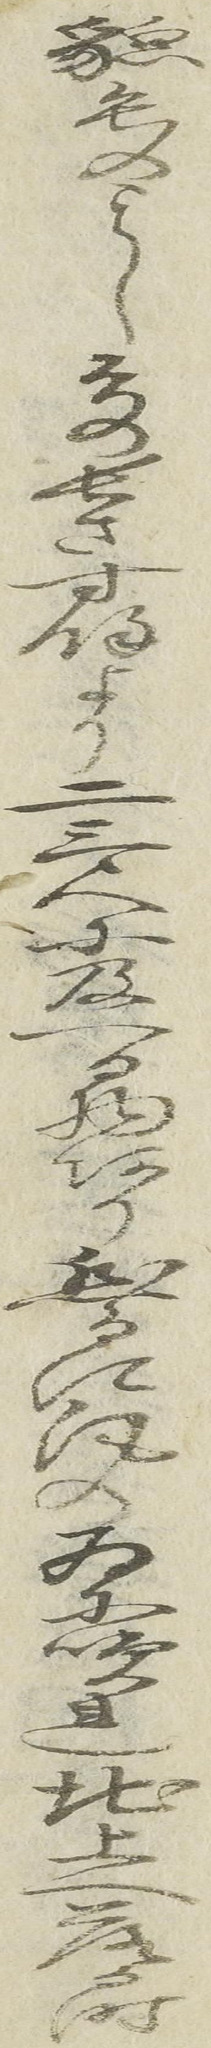貌毛のことしその長さ寸余よりニ三尺に及へる物あり然るに風の為に吹れ地上へ落る時

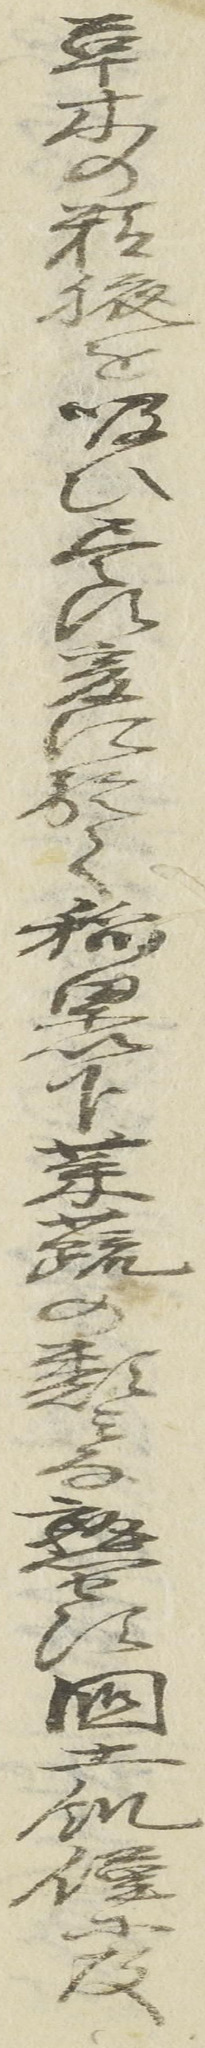草木の精腋を吸い尽す爰に於て稲果以下茱蔬の類ミな熟セす国土飢饉に及
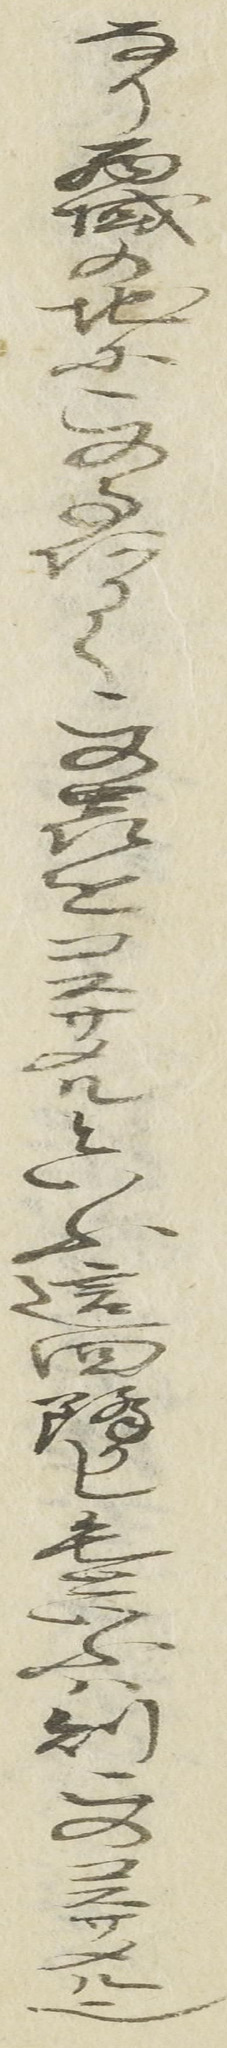なり西域の地にこの事ありてこの蟲をコスサメルといふ這回降りし毛といふは則このコスサメル也
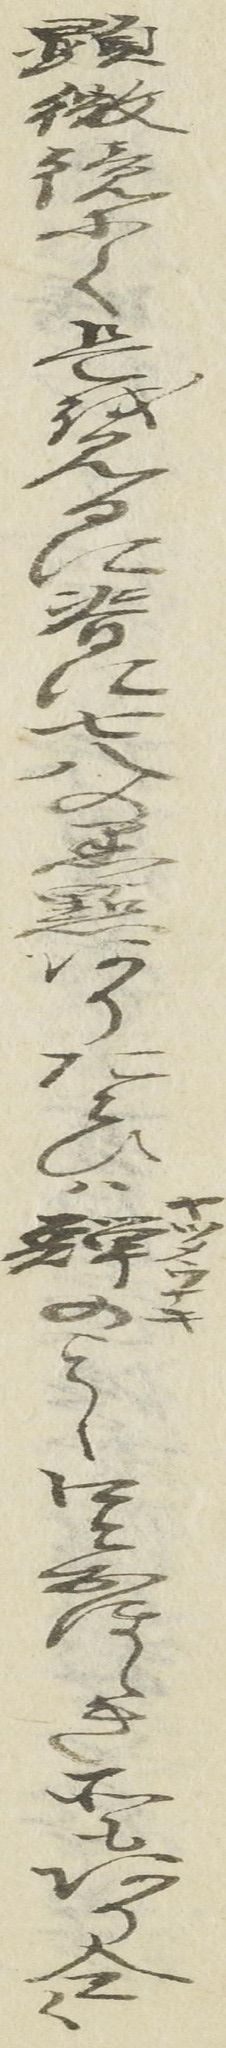顕微鏡にて是を見るに背に七八の黒點ありたとひハ鱓のことし口ニおほしき所もあり全く
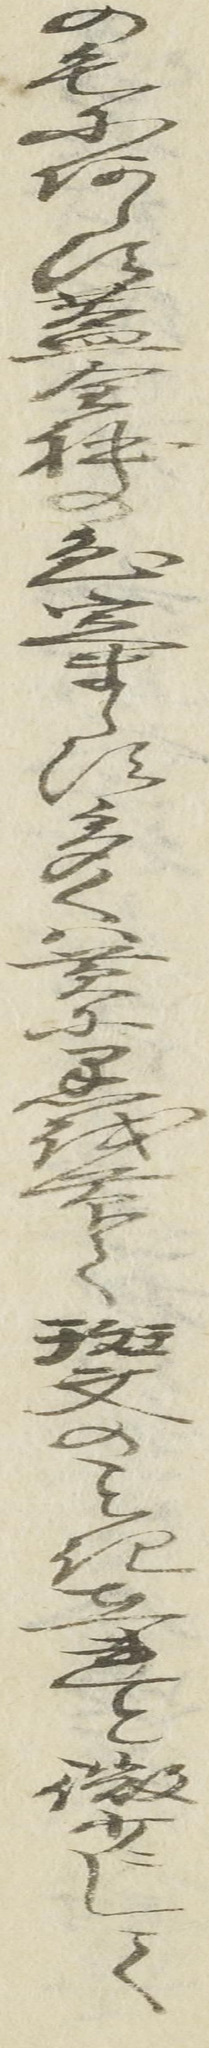の毛にあらす蓋全躰の色定まらす多くハ黄に黒を帯て斑文のことき在れと微少ニして
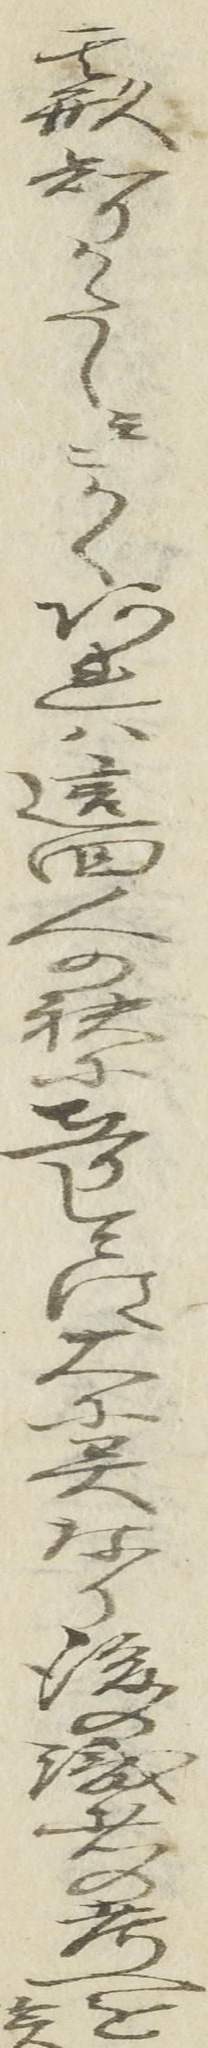其形知りかたし云云かくあれハ這回人の袂に在りしとは大に異なり後の識者の考へを俟
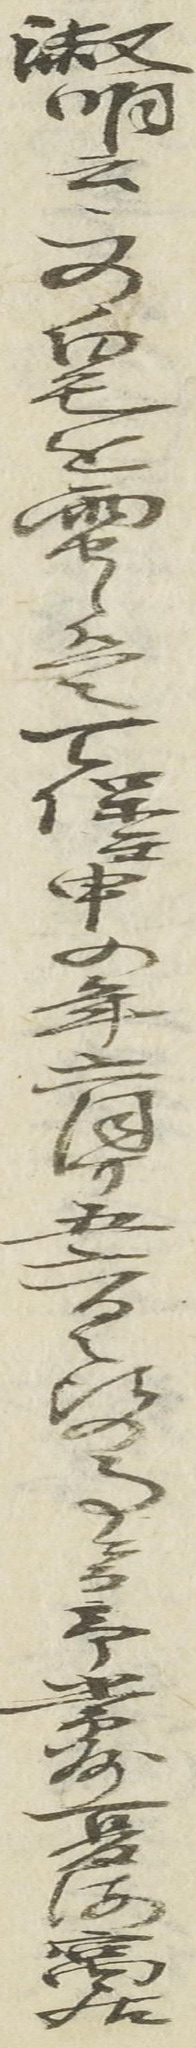淑明云この白毛を雨セしは天保壬申の年六月廿五六日之頃の事ニ而予常州夏海寓居
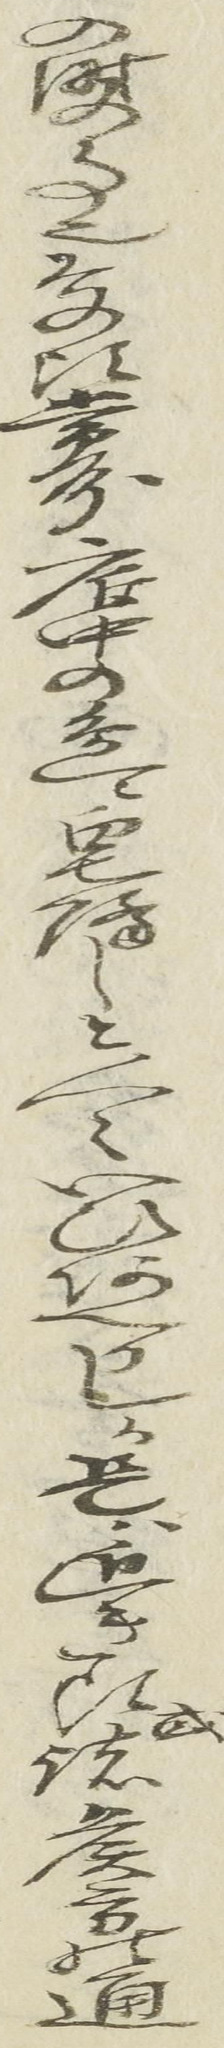の時の事也その頃常州府中の辺ニ白毛降しと人〻いひあへりしか是は近き頃或諸侯方の通
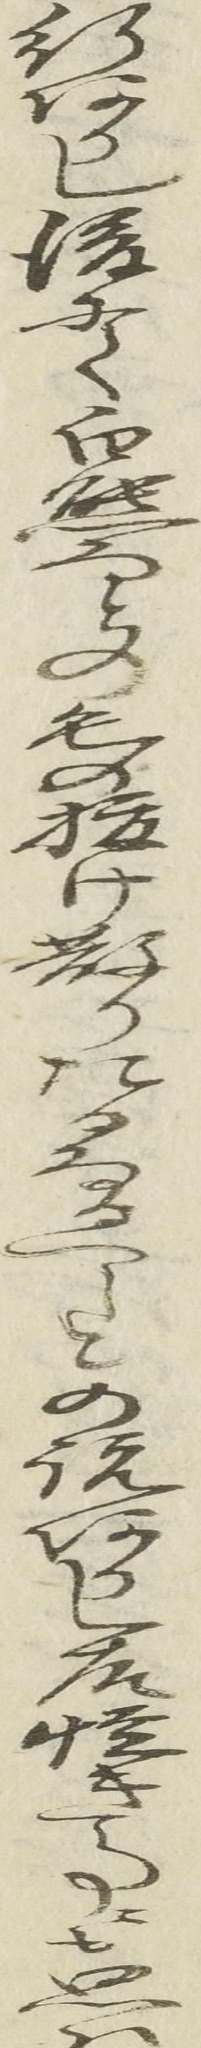行ありし後にて白熊なとの毛の抜け散りたるなるへしとの説ありし故怪き事ニも思ハ
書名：安政乙卯江戸大地震筆記　安政丙辰八月大阪大雷雨之記追加　安政三辰年七月松前辺大地震并八月大風雨記録
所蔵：東京大学地震研究所図書室 Earthquake Research Institute Library, The University of Tokyo, JAPAN
